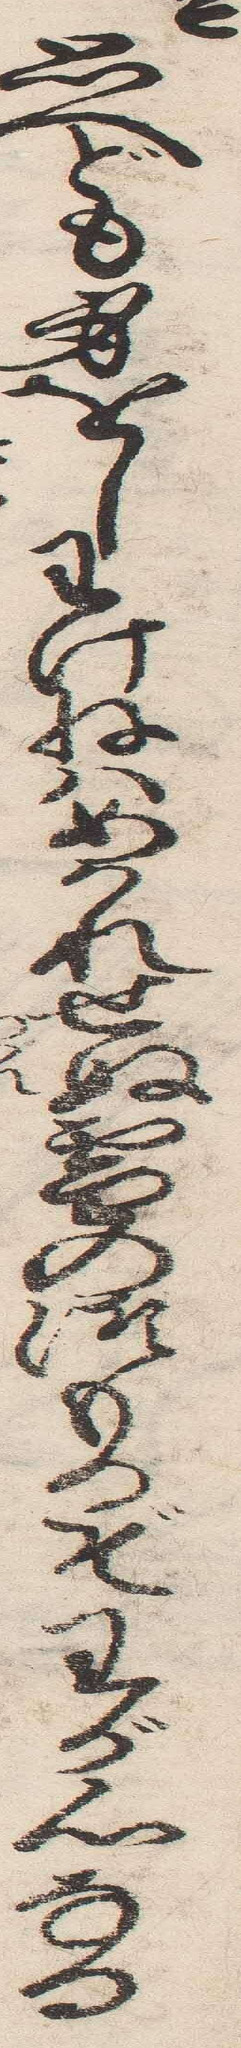古今思へども身をしわけねばめかれせぬ雪のつもるぞわが心なる
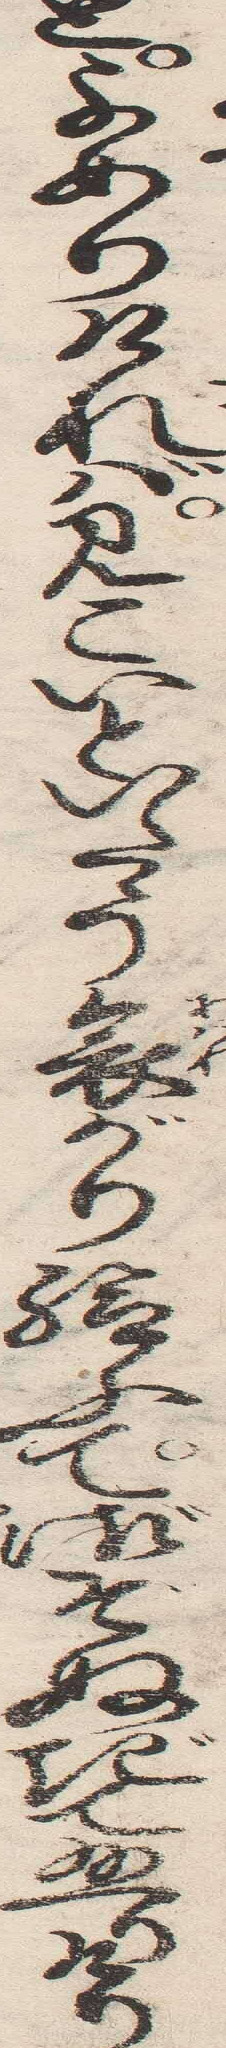と。よめりけれよめりければ。みこいといたう哀がり給ふて。御ぞぬぎて給へりけり
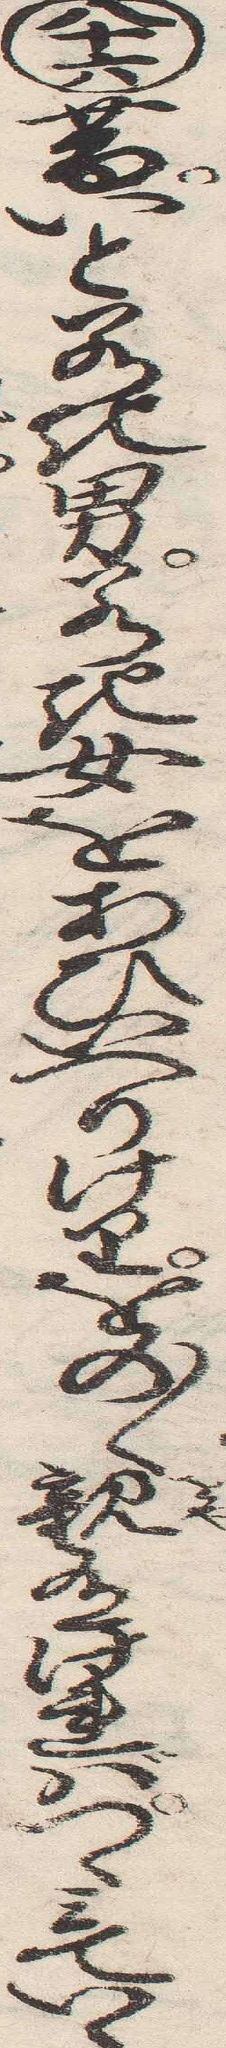八十六昔。いと若き男。若き女をあひいへりけり。をの〳〵親有ければ。つゝみていゝ
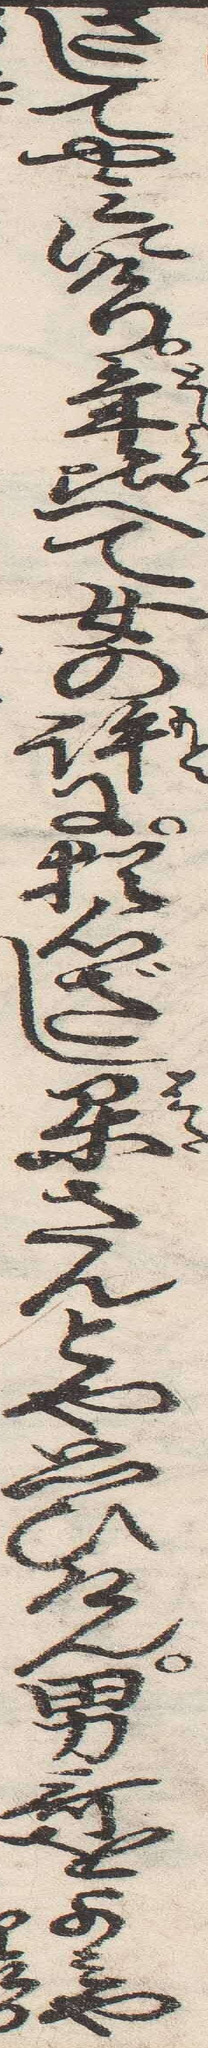さしてやみにけり。年比へて女の許に。猶心ざし果さんとや思ひけん。男哥をよみやりける
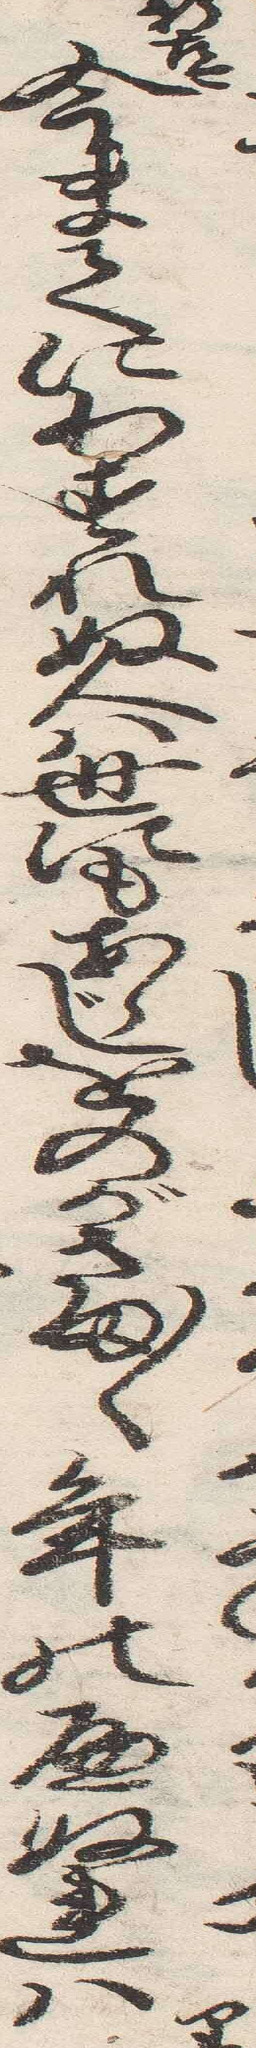新古今今まてにわすれぬ人は世にもあらじをのがさま〳〵年のへぬれは
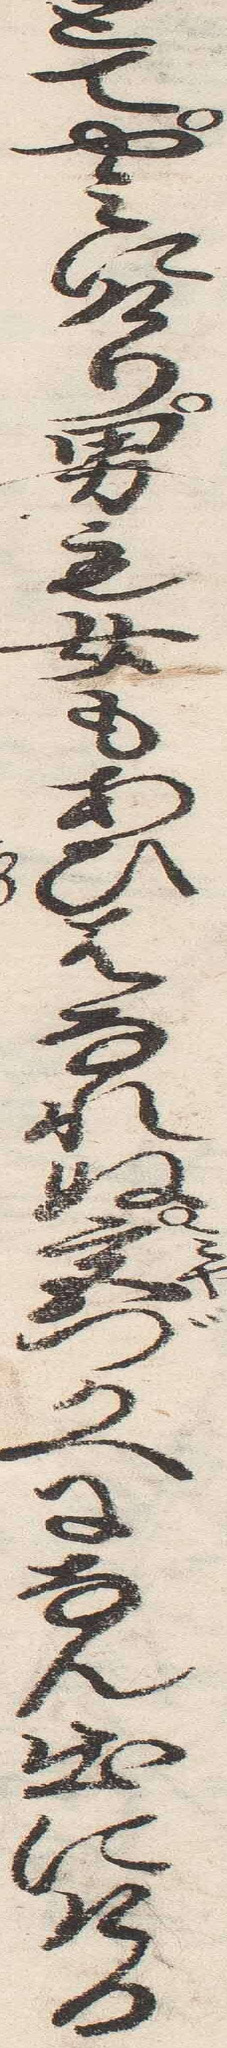とて。やみにけり。男も女もあひはなれぬ宮づかへになん出にける
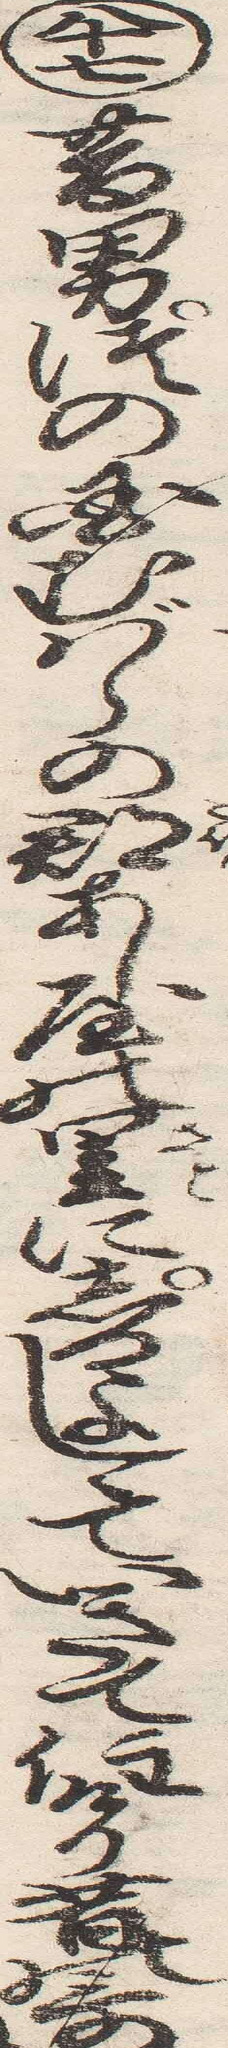八十七昔男。つの国むばらの郡あし屋の里に。しるよしゝていきて住けり昔の哥に
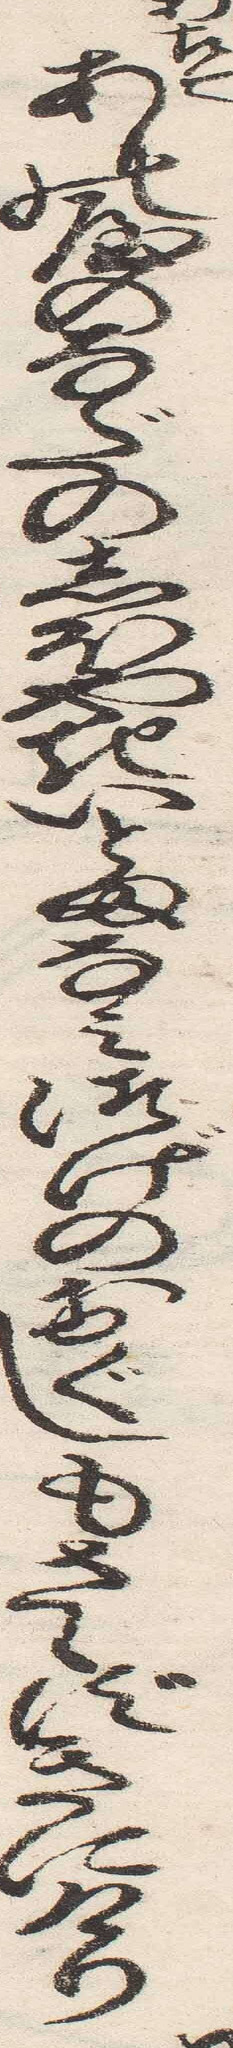新古今あしの屋のなだのしほやきいとまなみつげのおぐしもさゝずきにけり
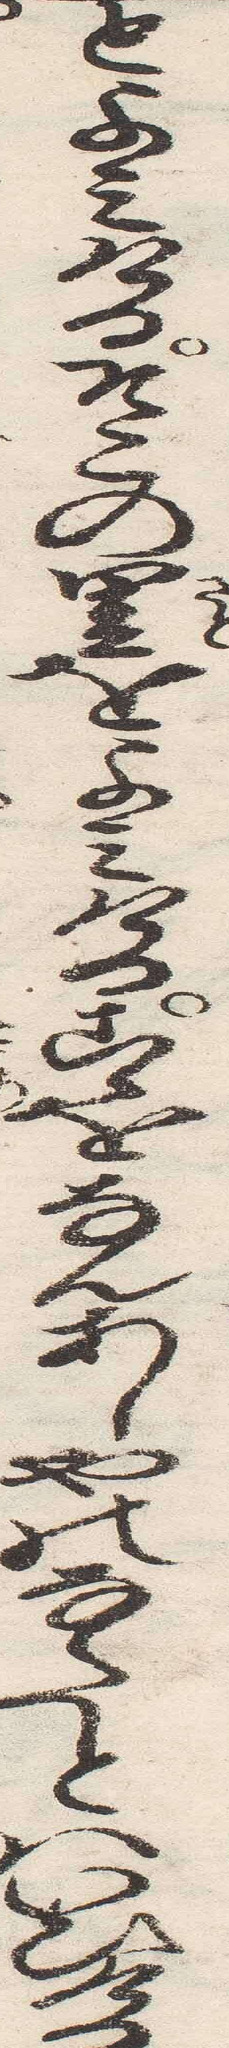とよみける。そこの里をよみける。こゝをなんあしやのなたとはいひける
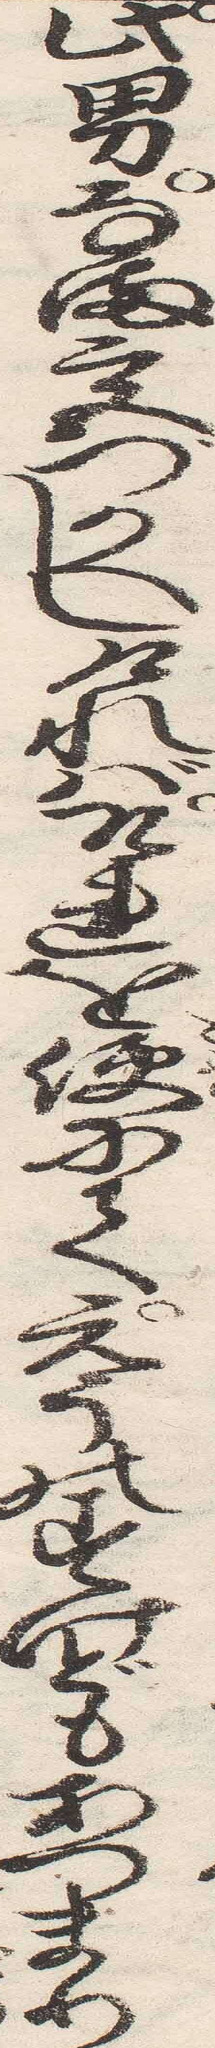。此男。なま宮づかへしければ。それを便にて。えうのすけどもあつまり。
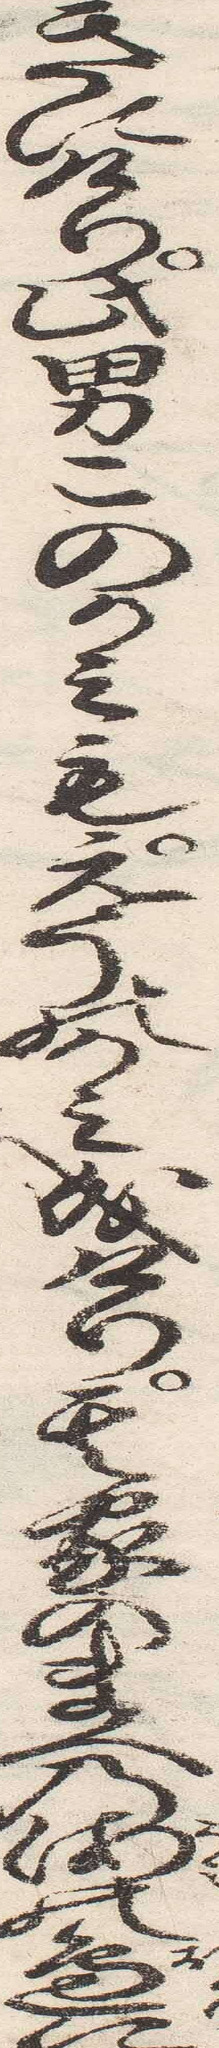きにけり。此男このかみも。えうのかみ成けり。其家のまへの海の辺に
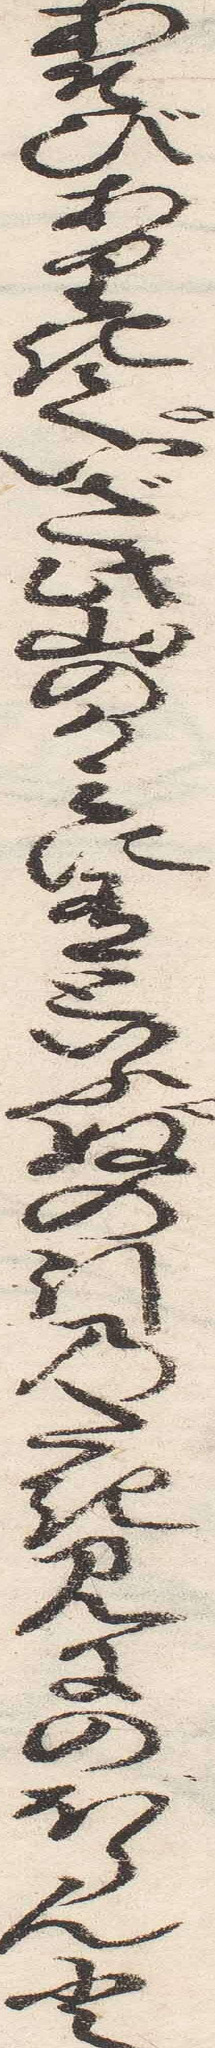あそびありきて。いざ此山のかみに有といふ。ぬの引のたき見にのぼらんと
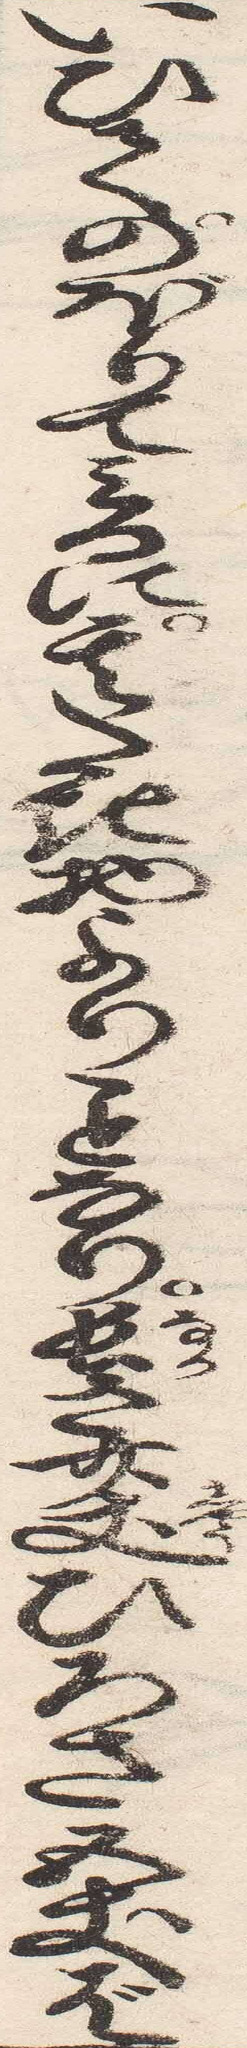いひて。のぼりてみるに。其たき物よりことなり。長さ廿丈ひろさ五丈ば
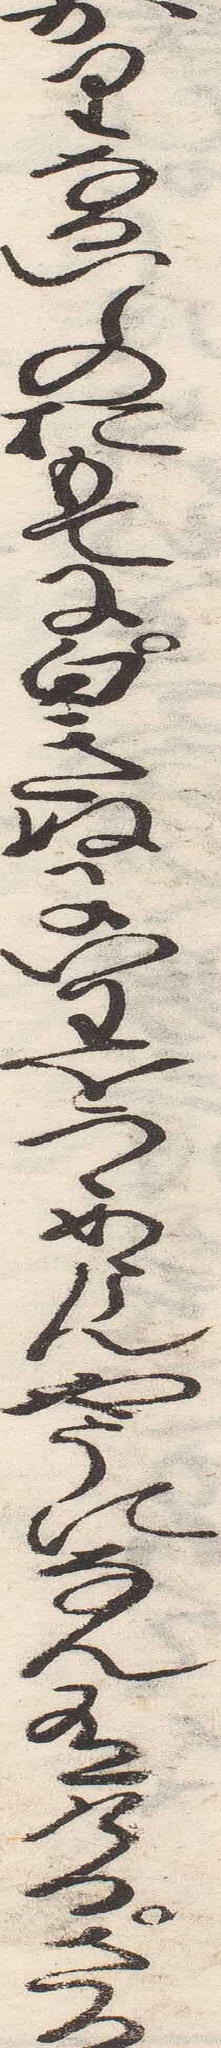かりなるいしのおもてに。白きぬにいわをつゝめらんやうになん有ける。さる
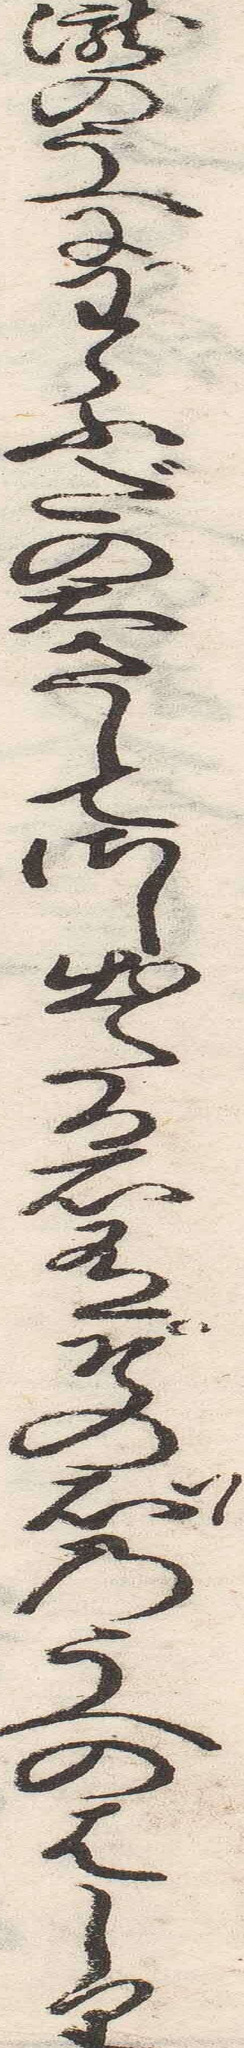滝のうへに。わらふだの大さしてさし出たる石有。その石のうへのはしり
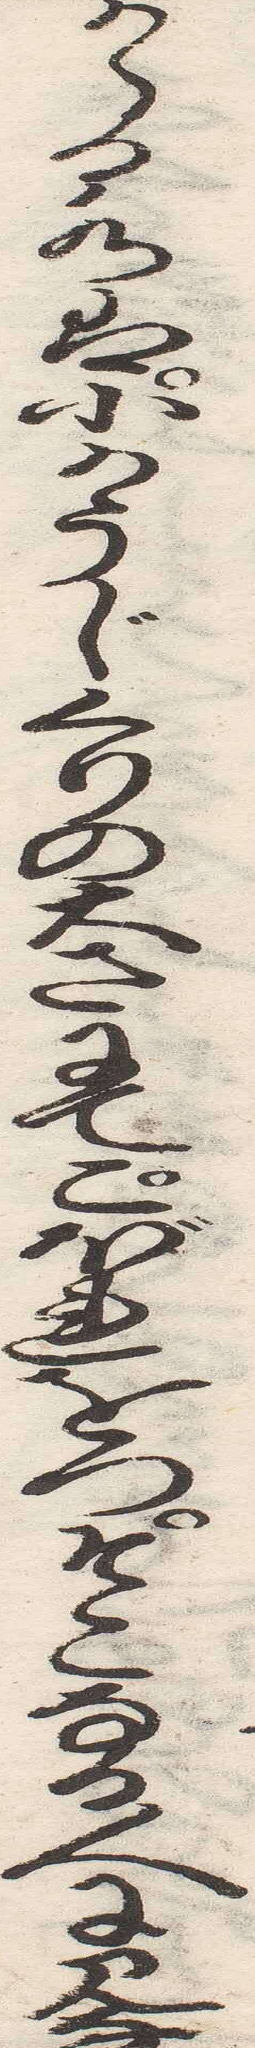かゝる水は。小かうじくりの大さにて。こぼれをつ。そこなる人にみな
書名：伊勢物語
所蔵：東京学芸大学附属図書館 国文学研究資料館
